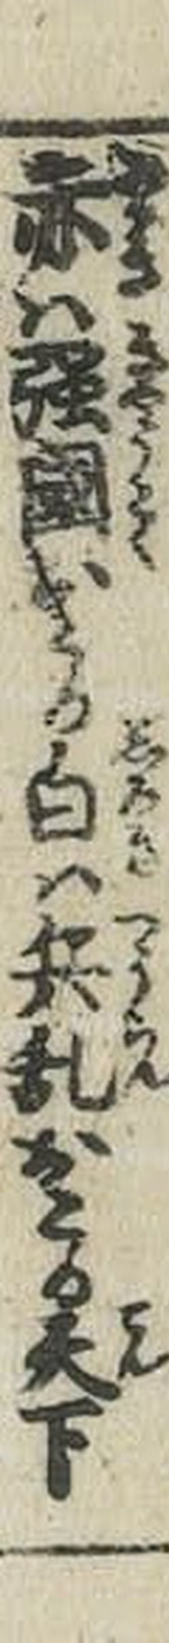赤は強国おこる白は兵乱おこる天下
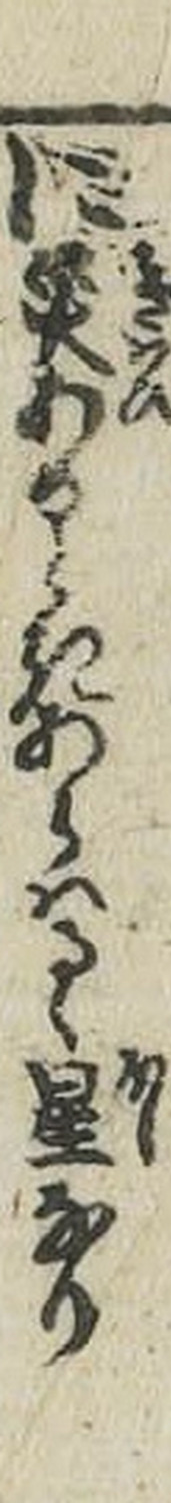に災あるときあらはるゝ星なり
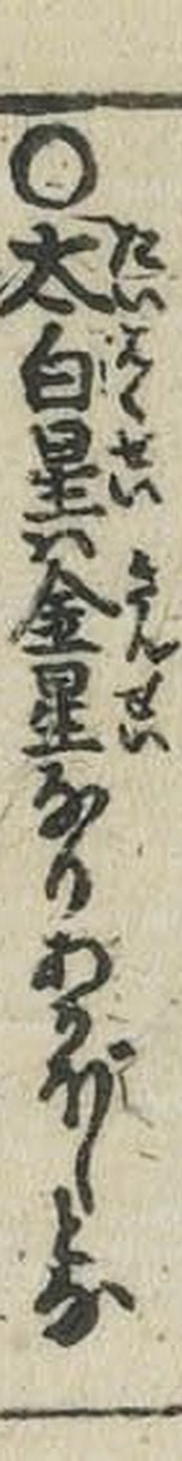○太白星は金星なりあかぼしとな
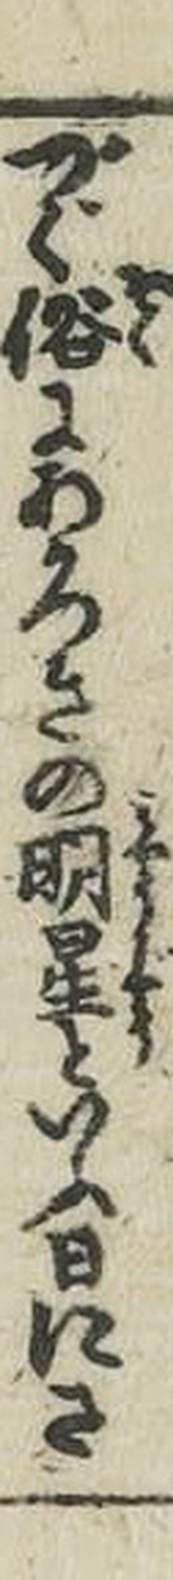づく俗にあかつきの明星といふ日にさ
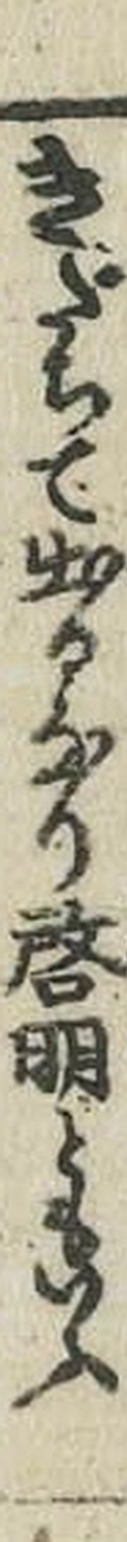きだちて出るなり啓明ともいふ
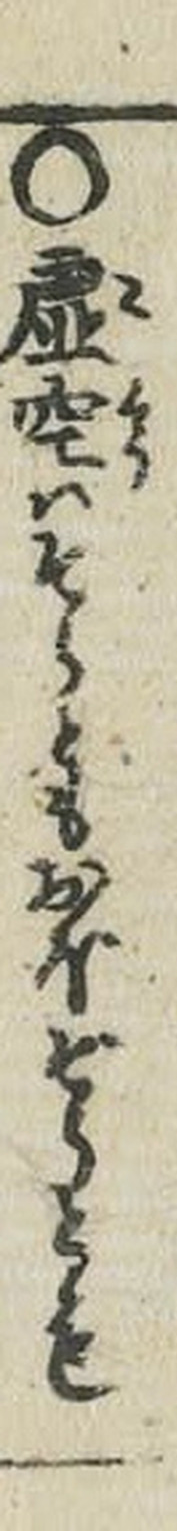○虚空はそらともおほぞらとも
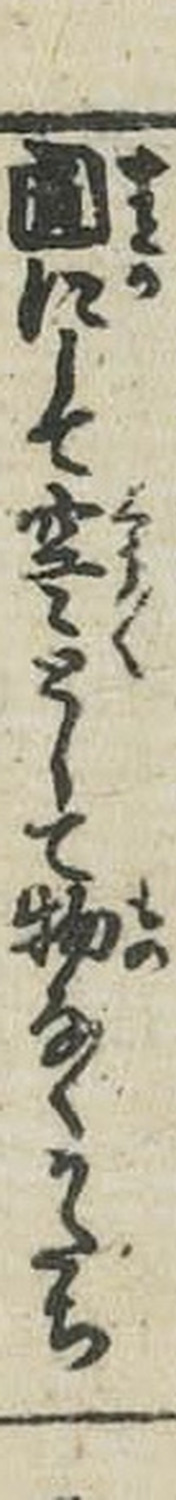円にして空々として物なくかたち
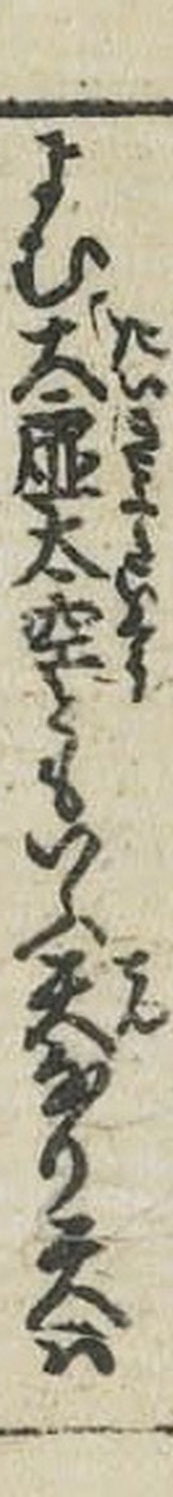よむ太虚太空ともいふ天なり天は
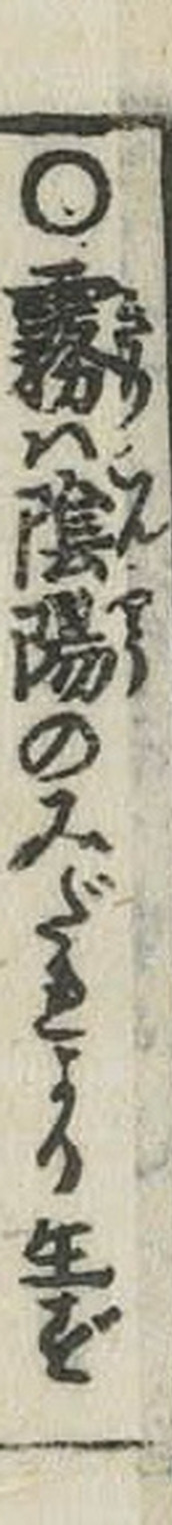○霧は陰陽のみだれより生ず
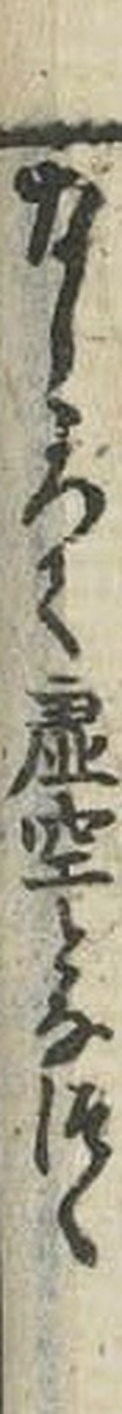なしよつて虚空となつく
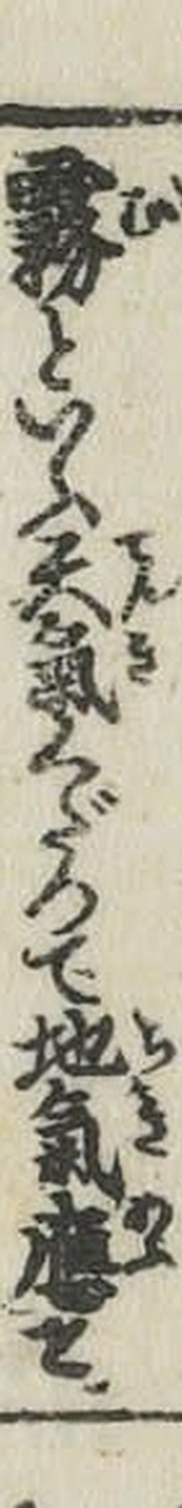霧といふ天気くだつて地気応せ
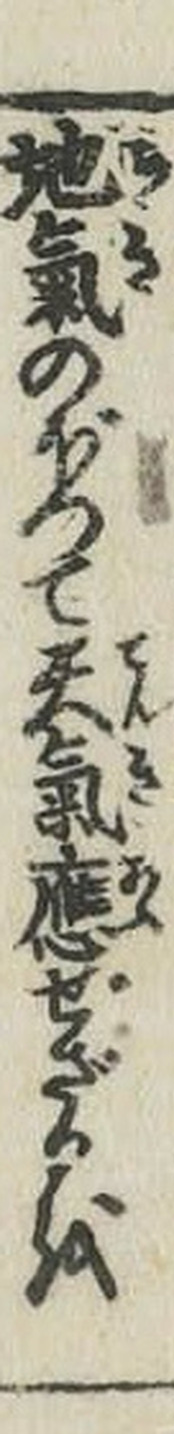地気のぼつて天気応ぜざるを
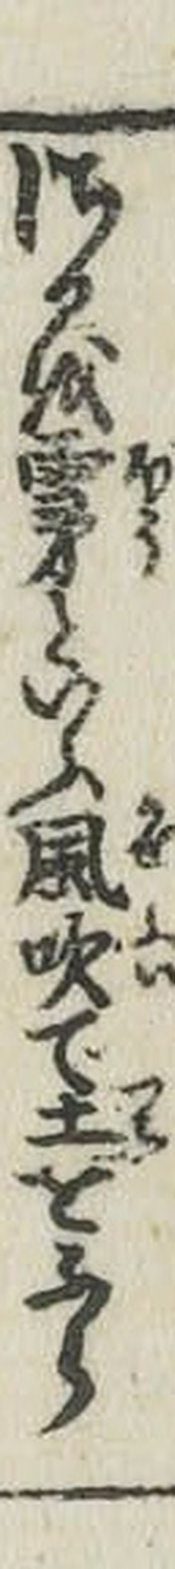さるを雺といふ風吹て土をふら
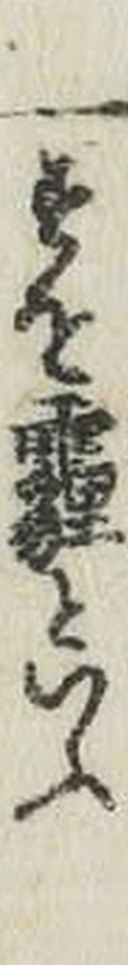すを霾といふ
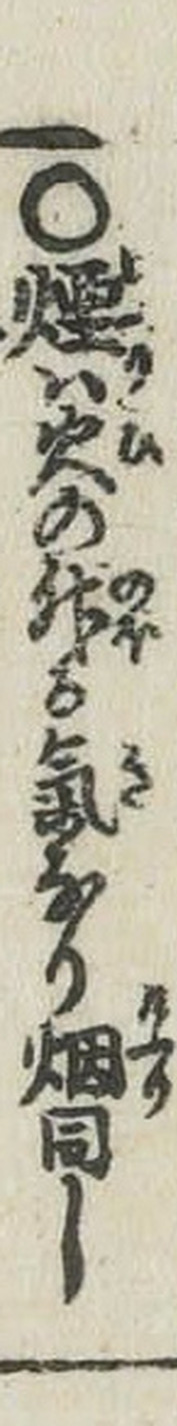○煙は火の昇る気なり烟同し
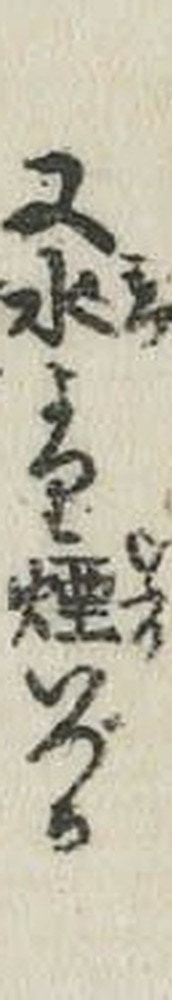又水より煙いづる
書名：増補頭書訓蒙図彙大成 10巻 2:巻之1-3
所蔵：東京学芸大学教育コンテンツアーカイブ
